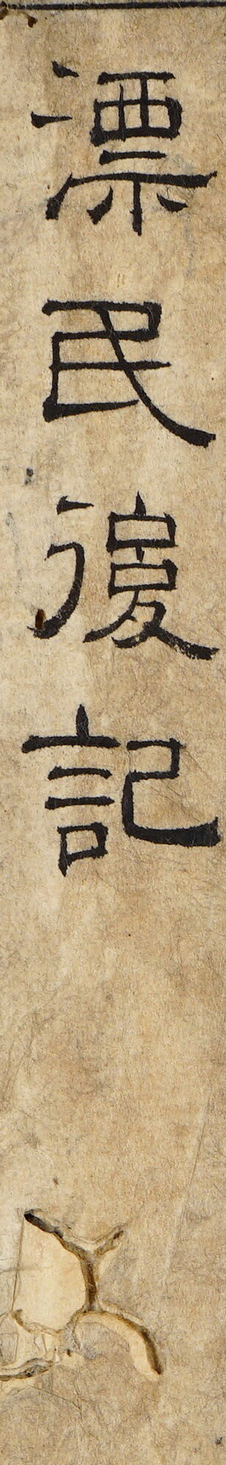漂民後記
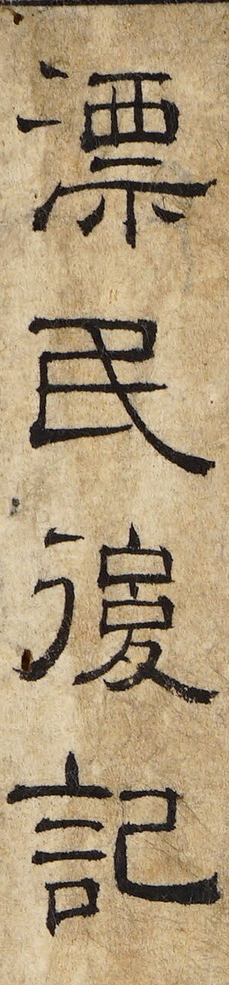漂民後記

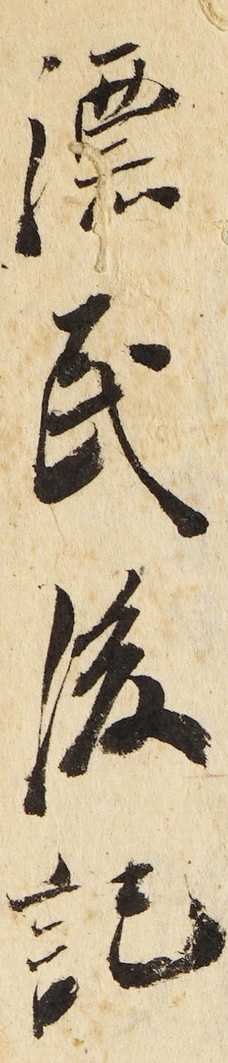漂民後記

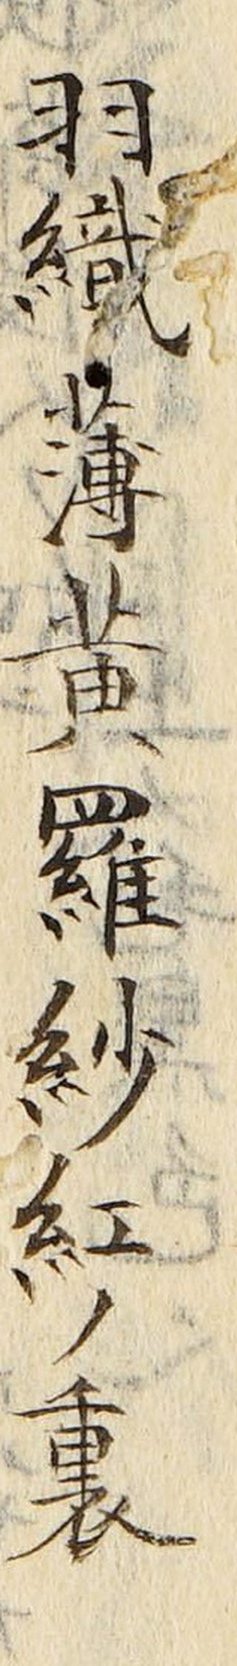羽織薄黄羅紗紅ノ裏
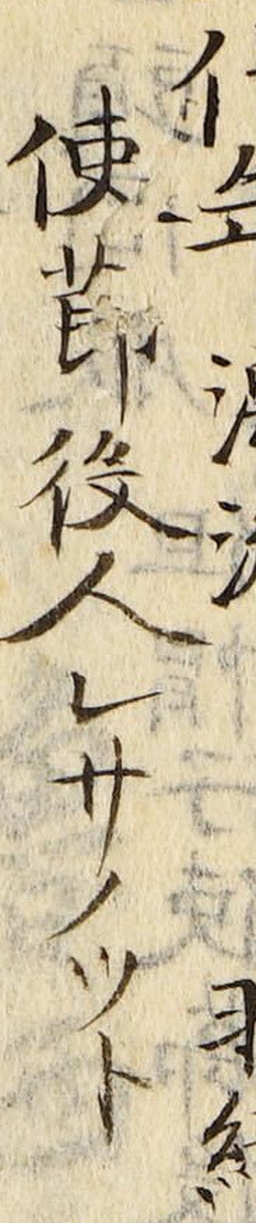使節役人レサノツト
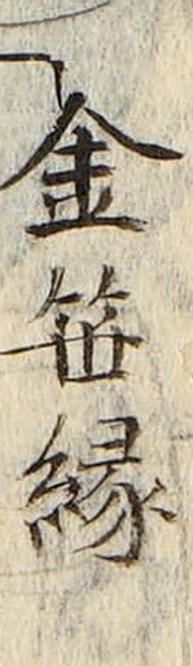金笹縁
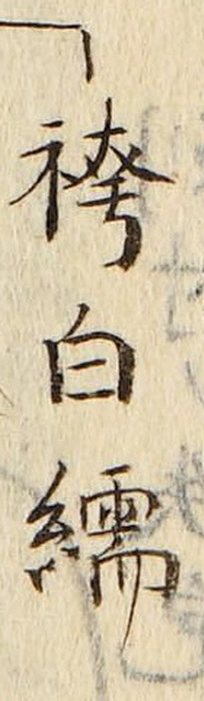袴白繻
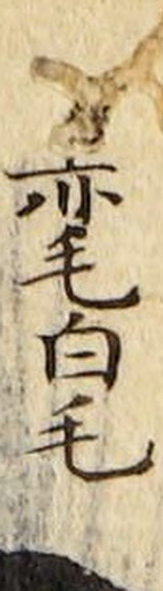赤毛白毛

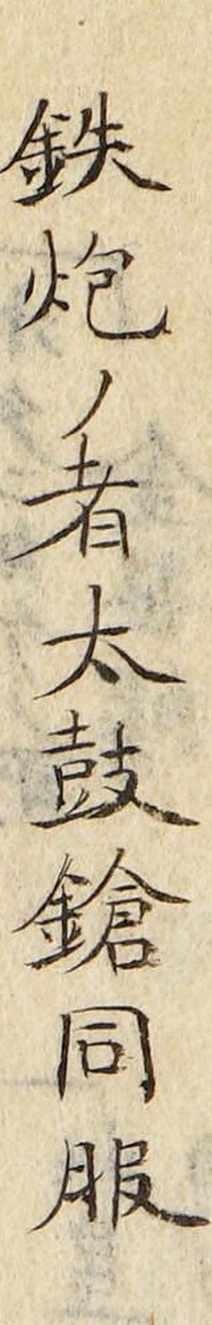鉄炮ノ者太鼓鎗同服
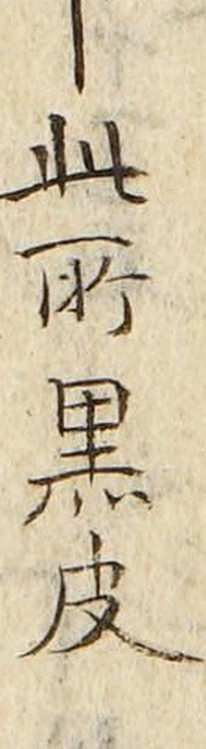此所黒皮
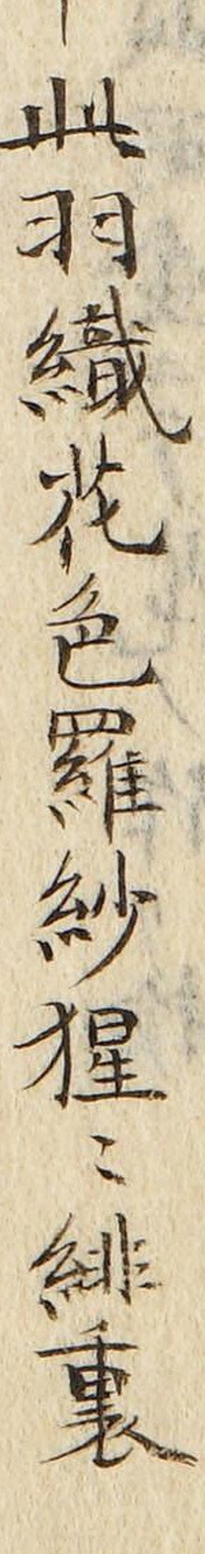此羽織花色羅紗猩々緋裏
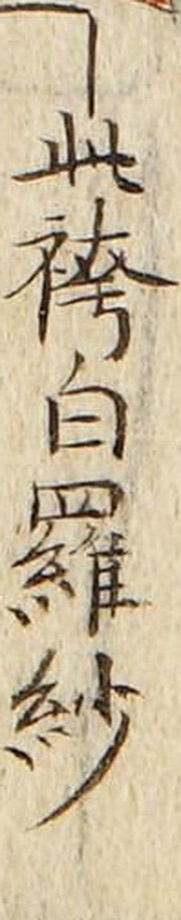此袴白羅紗
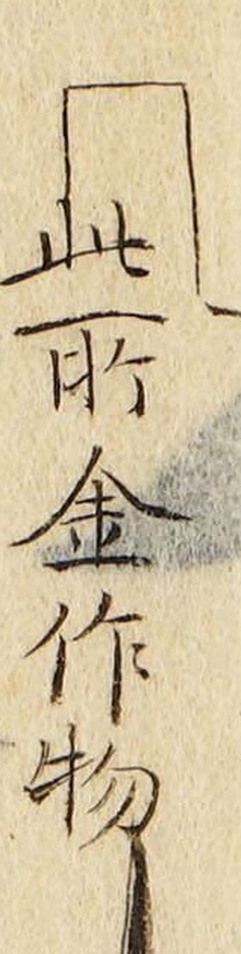此所金作物
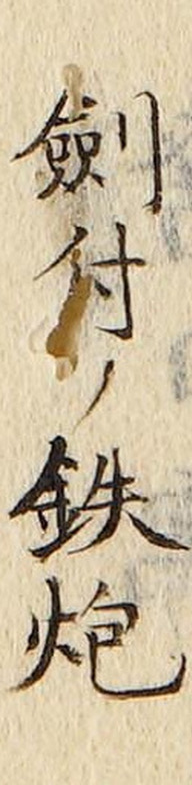剣付ノ鉄炮
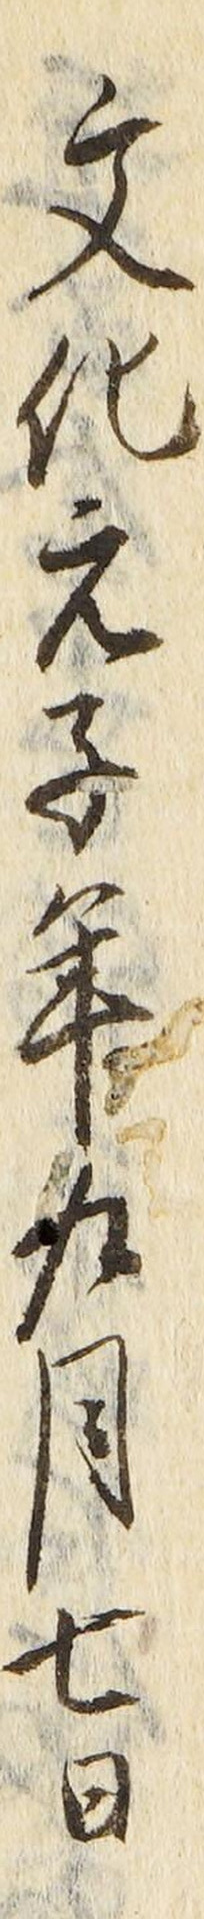文化元子年九月七日
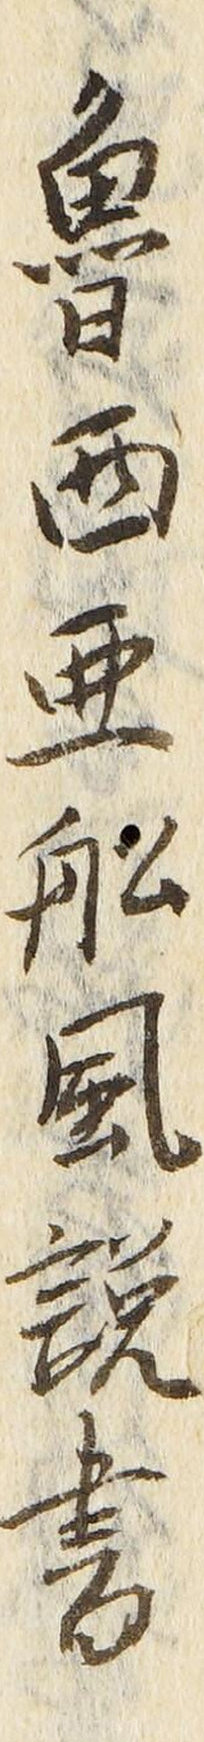魯西亜船風説書
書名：漂民後記
